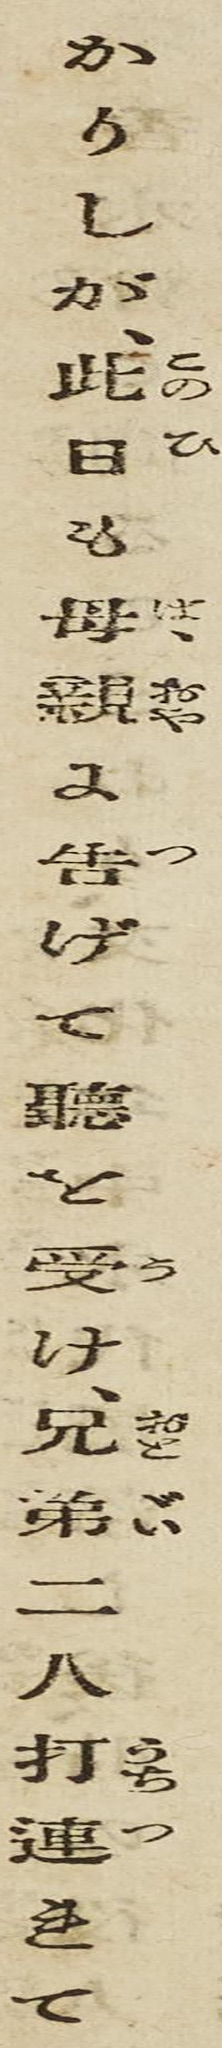かりしが、此日も母親に告げて聴を受け、兄弟二人打連れて
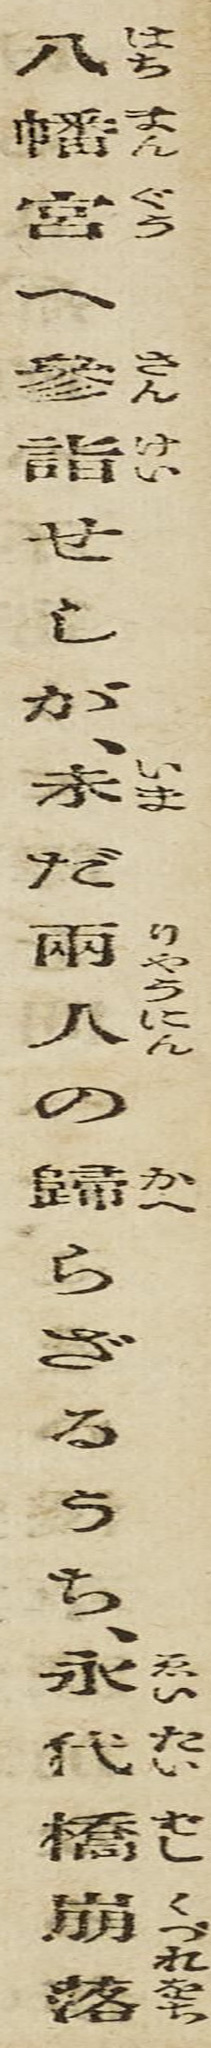八幡宮へ参詣せしが、未だ両人の帰らざるうち、永代橋崩落
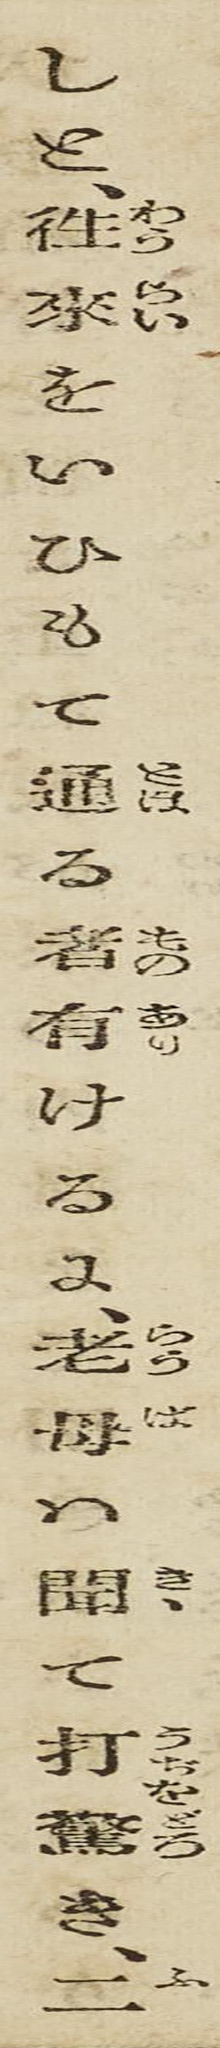しと、往来をいひもて通る者有けるに、老母は聞て打驚き、二
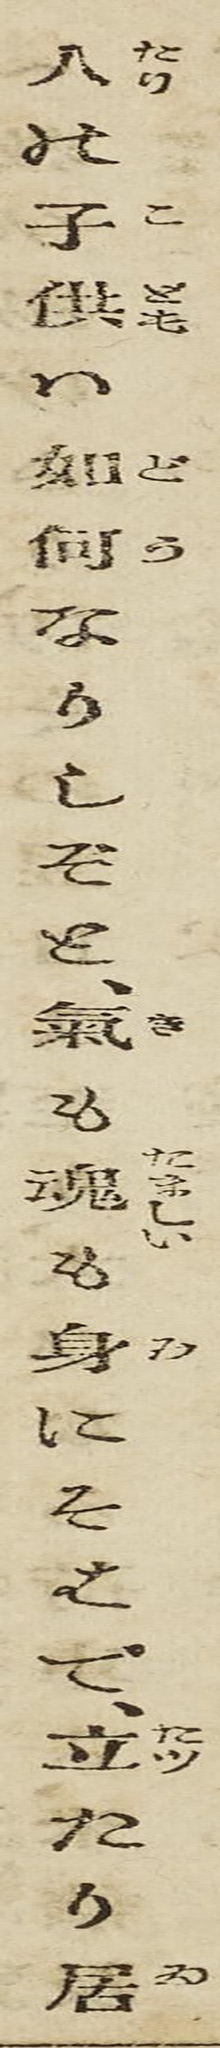人の子供は如何なりしぞと、気も魂も身にそはで、立たり居
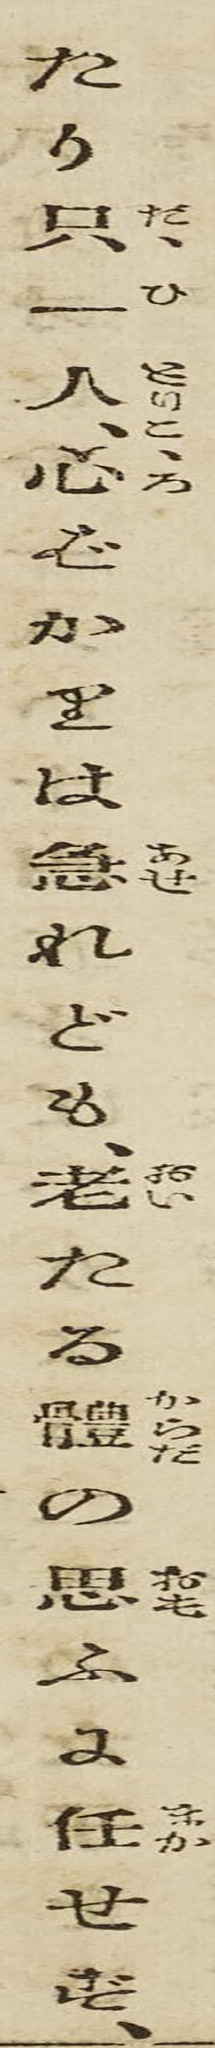たり只一人、心ばかりは急れども、老たる体の思ふに任せず、
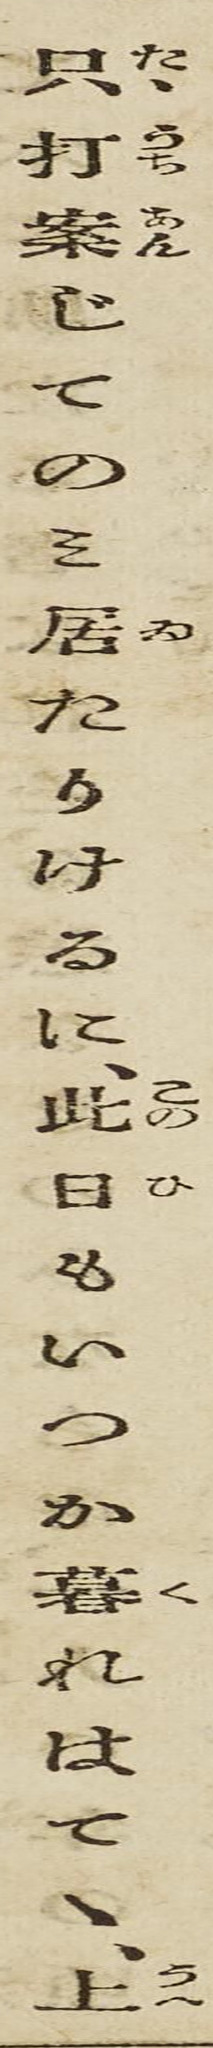只打案じてのみ居たりけるに、此日もいつか暮れはてゝ、上
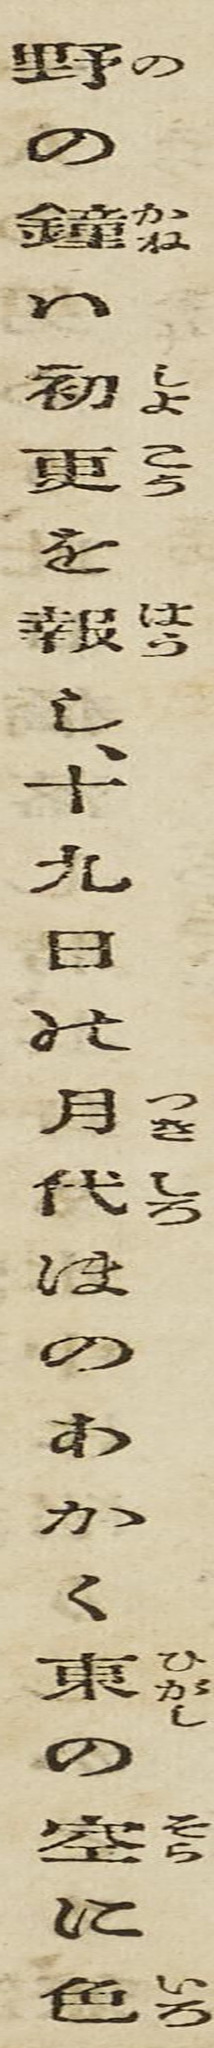野の鐘は初更を報し、十九日の月代ほのあかく東の空に色
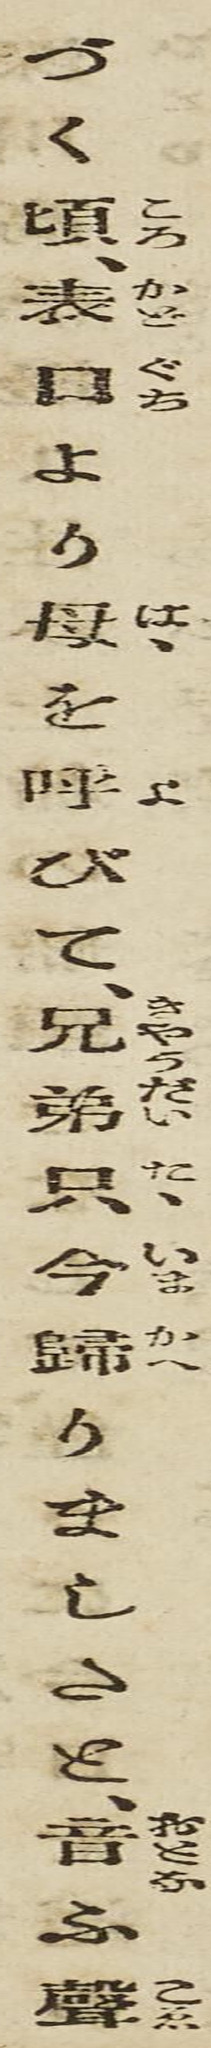づく頃、表口より母を呼びて、兄弟只今帰りましたと、音ふ声
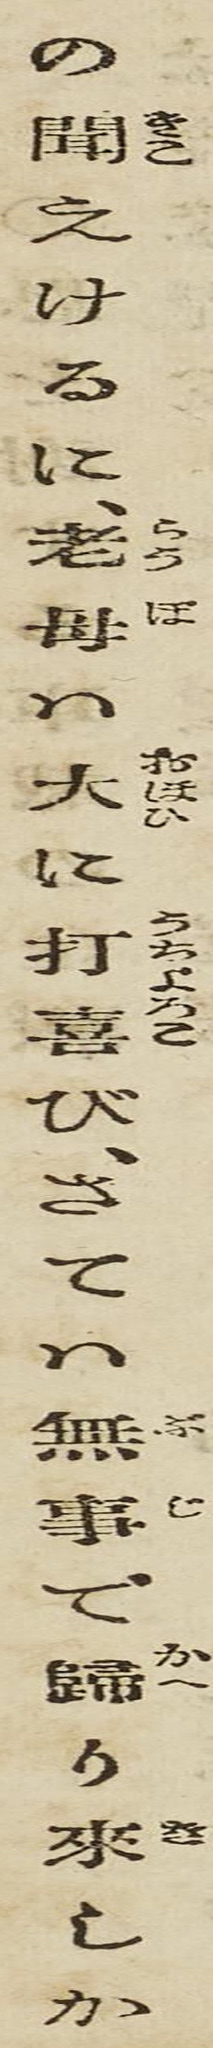の聞へえけるに、老母は大に打喜び、さては無事で帰り来しか
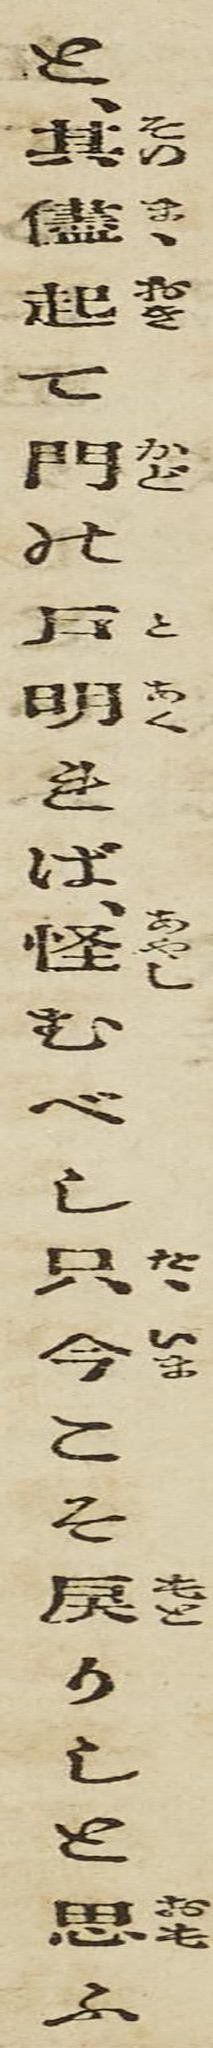と、其侭起て門の戸明れば、怪むべし只今こそ戻りしと思ふ
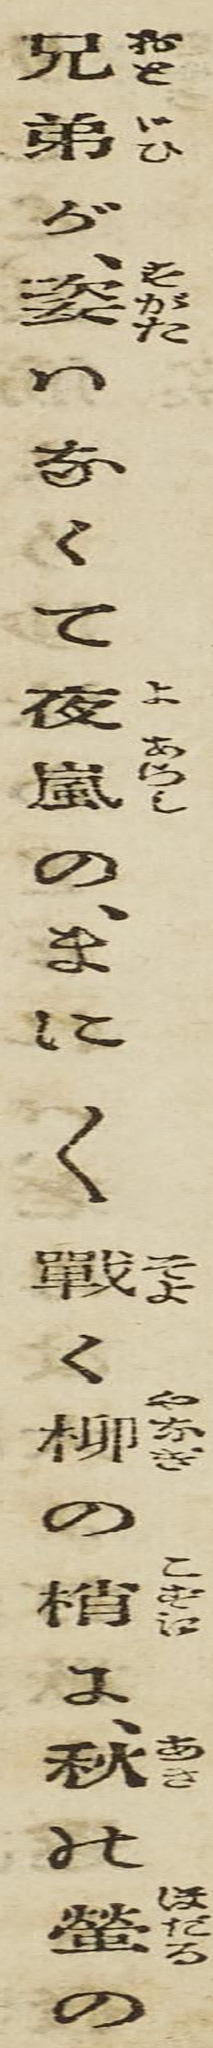兄弟が、姿はなくて夜嵐の、まに〳〵戦く柳の梢に秋の蛍の
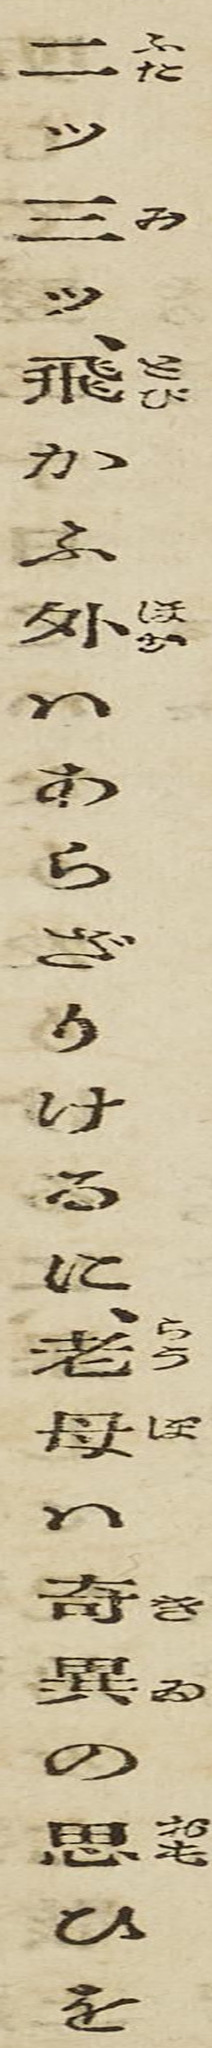二ツ三ツ、飛かふ外はあらざりけるに、老母は奇異の思ひを
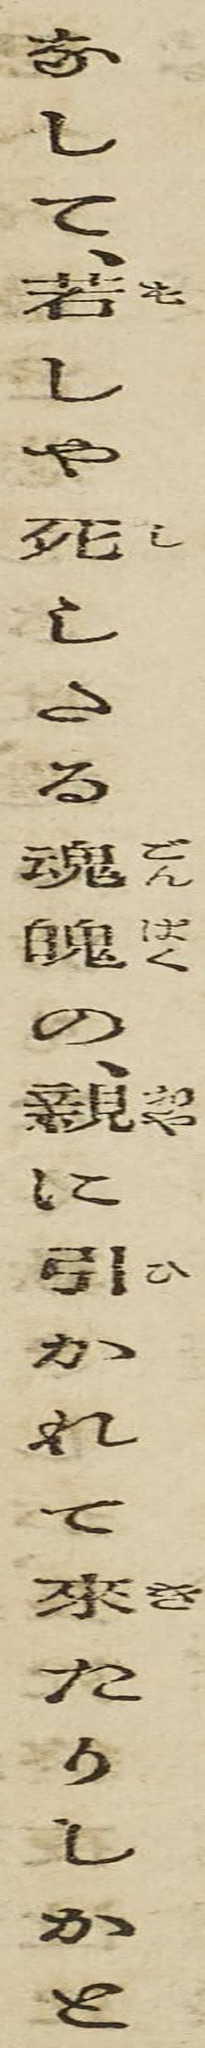なして、若しや死したる魂魄の、親に引かれて来たりしかと

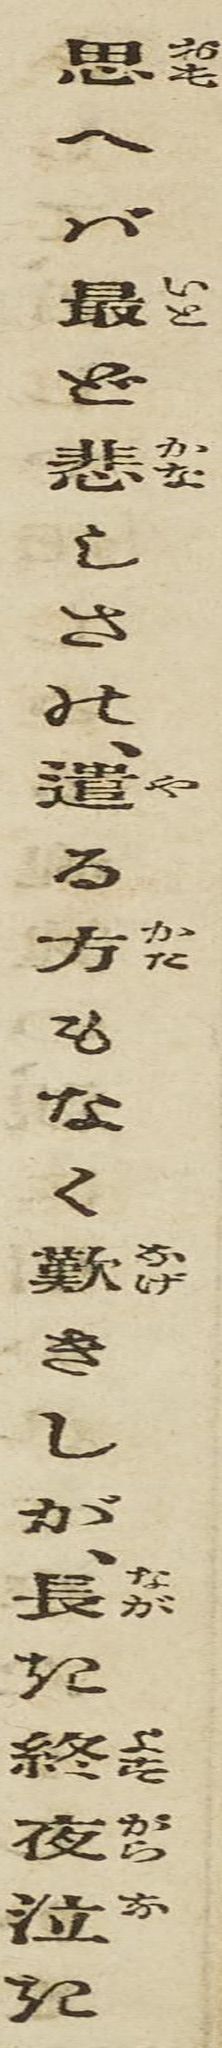思へば最ど悲しさの、遣る方もなく歎きしが、長き終夜泣き
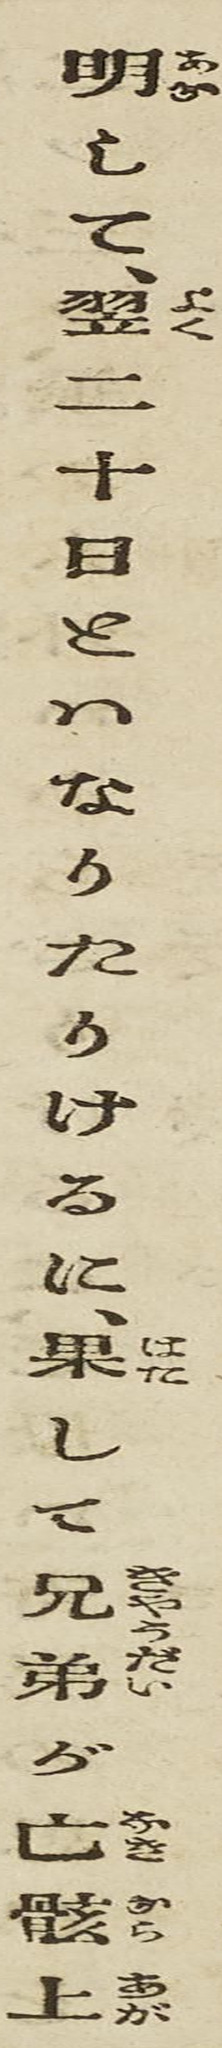明して、翌二十日とはなりたりけるに、果して兄弟が亡骸上
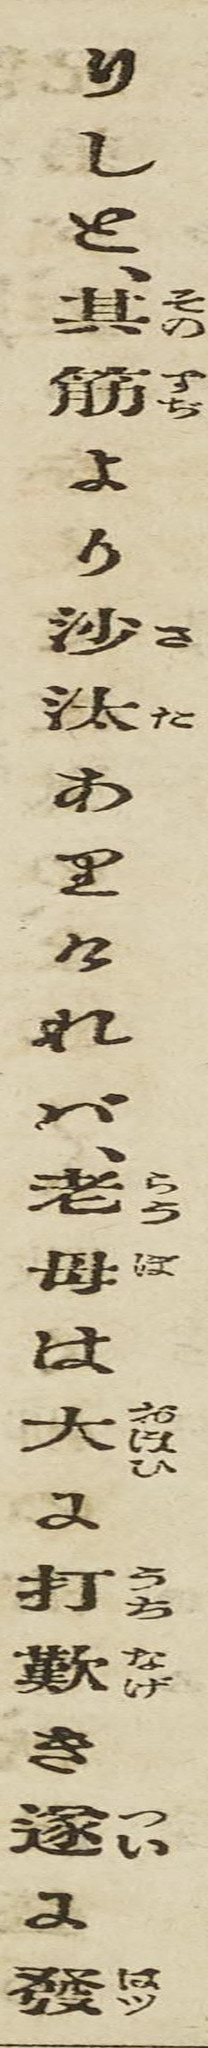りしと、其筋より沙汰ありければ、老母は大に打歎き遂に発
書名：永代惨話　文化の夢　全
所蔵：東京大学地震研究所図書室 Earthquake Research Institute Library, The University of Tokyo, JAPAN
